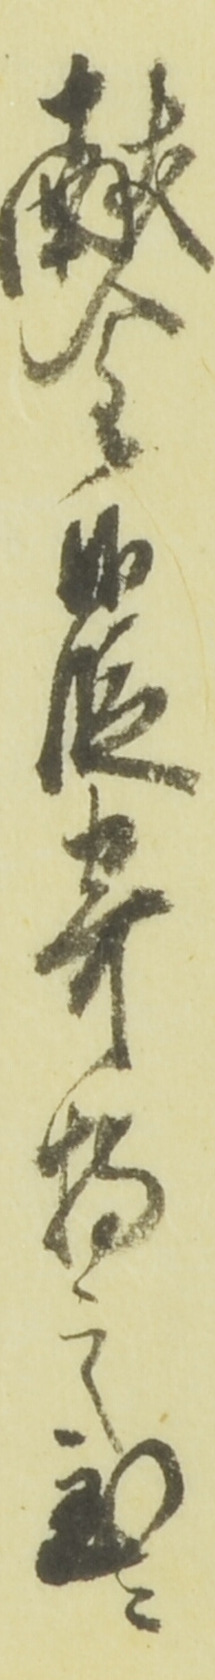献金候段寄特之至ニ
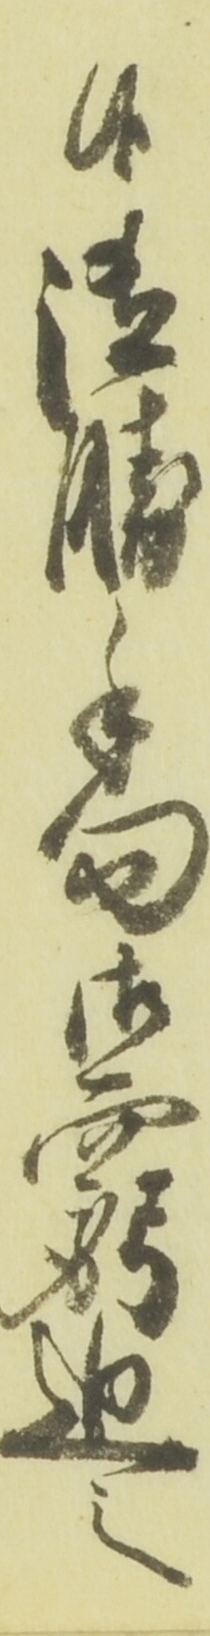候御勝手向御窮迫之
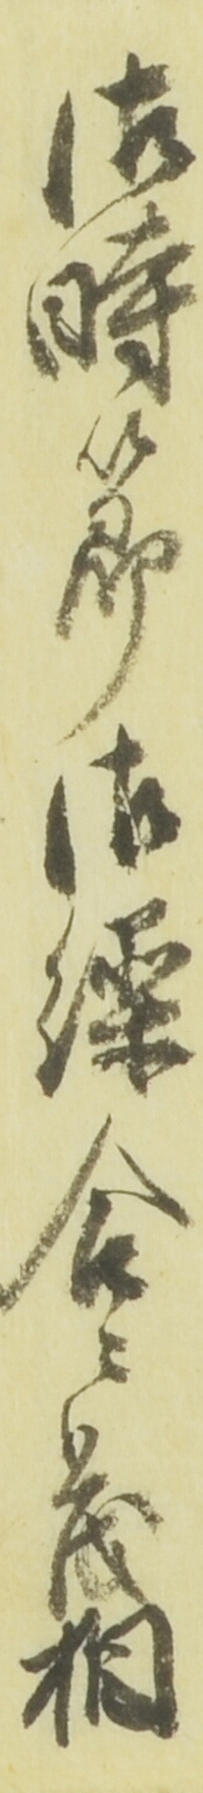御時節御繰合ニも相
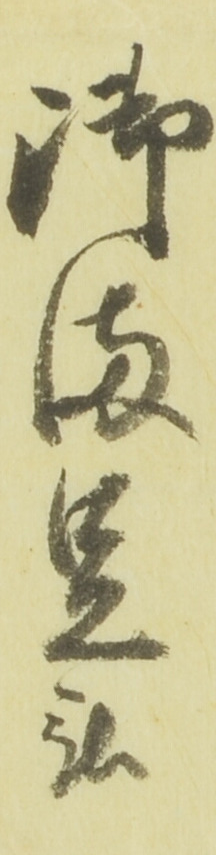御満足被
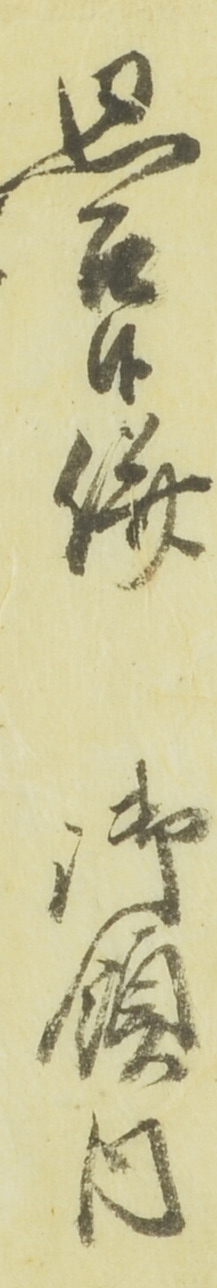思召候併御領内
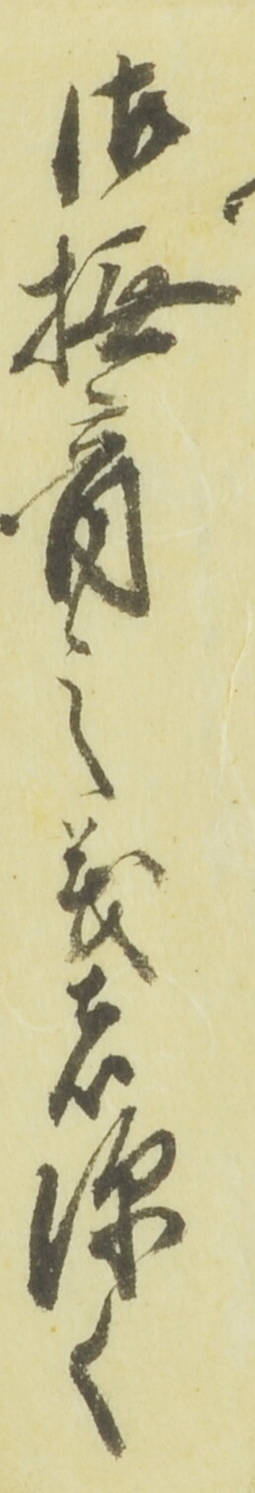御撫育之義は深く
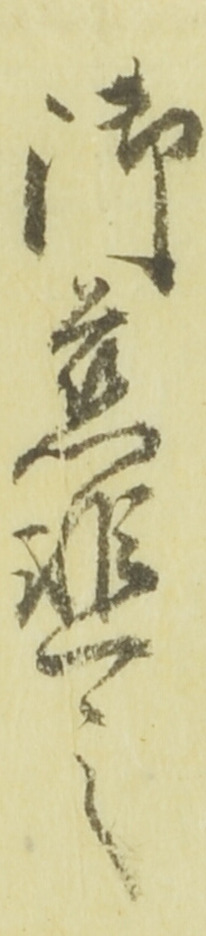御慈悲之
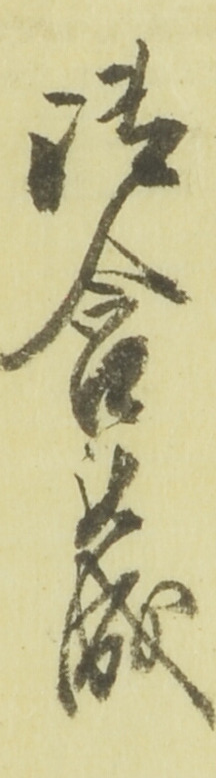御含被成
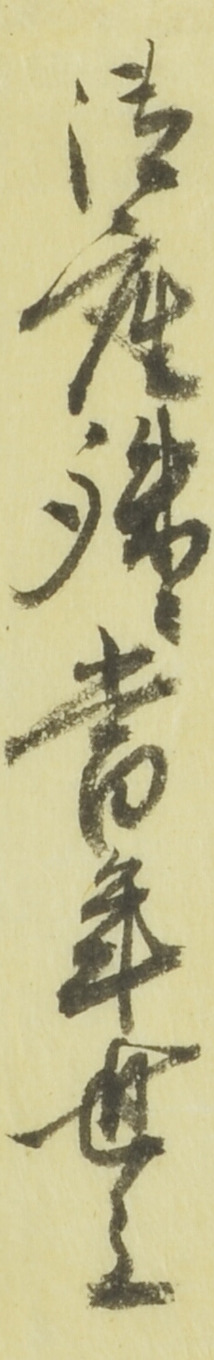御座殊ニ当年世上
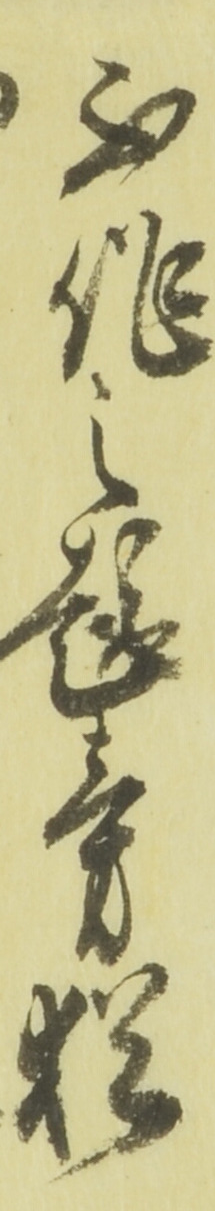不作之趣旁猶
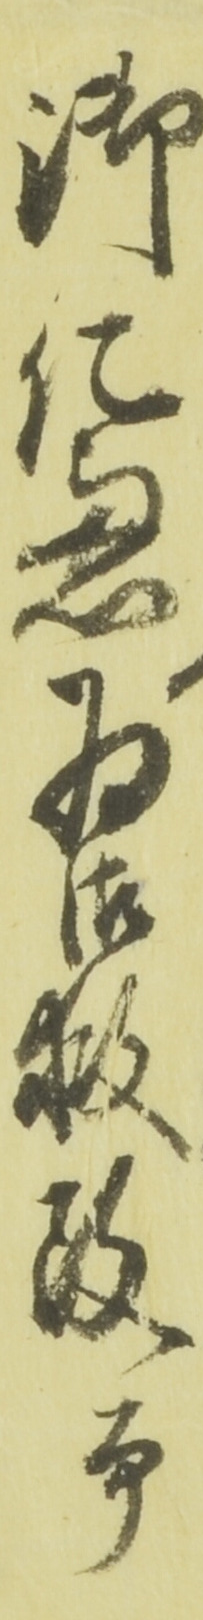御仁恵為御救改而
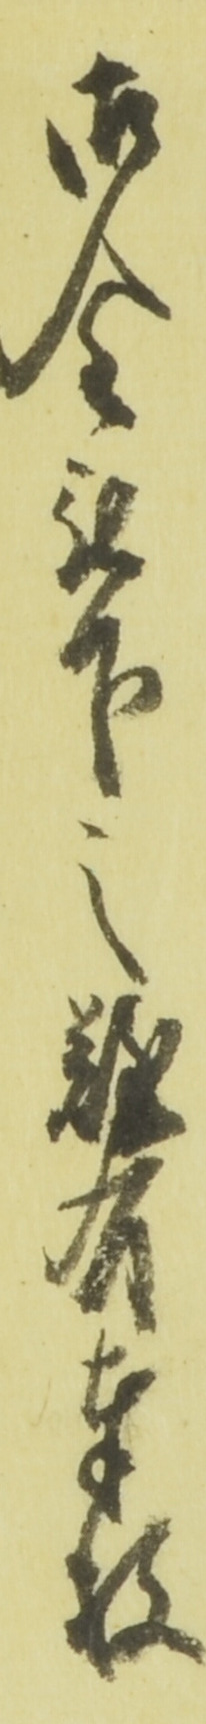御金被下之難有奉存
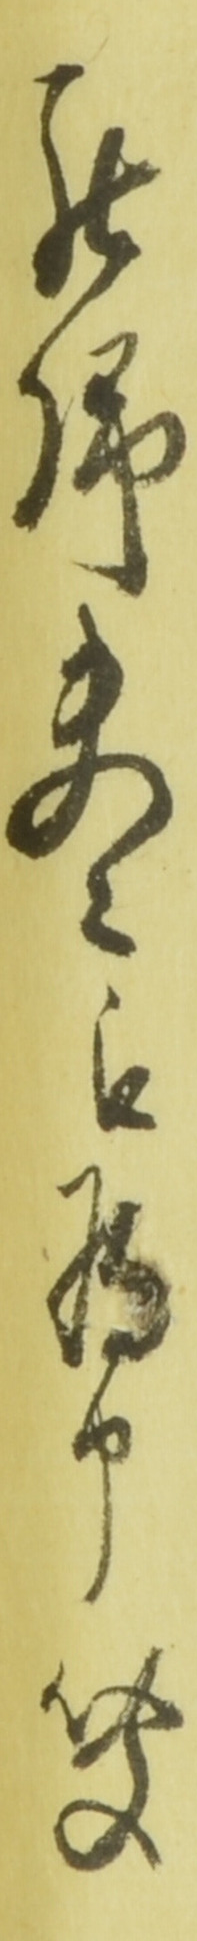罷帰夫々江為申聞
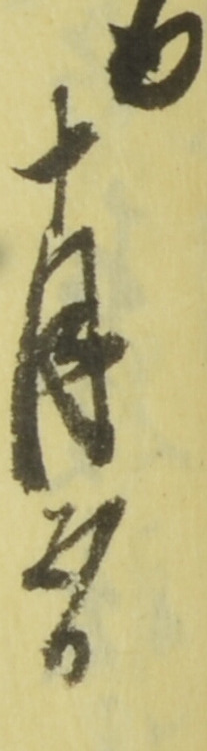十月五日

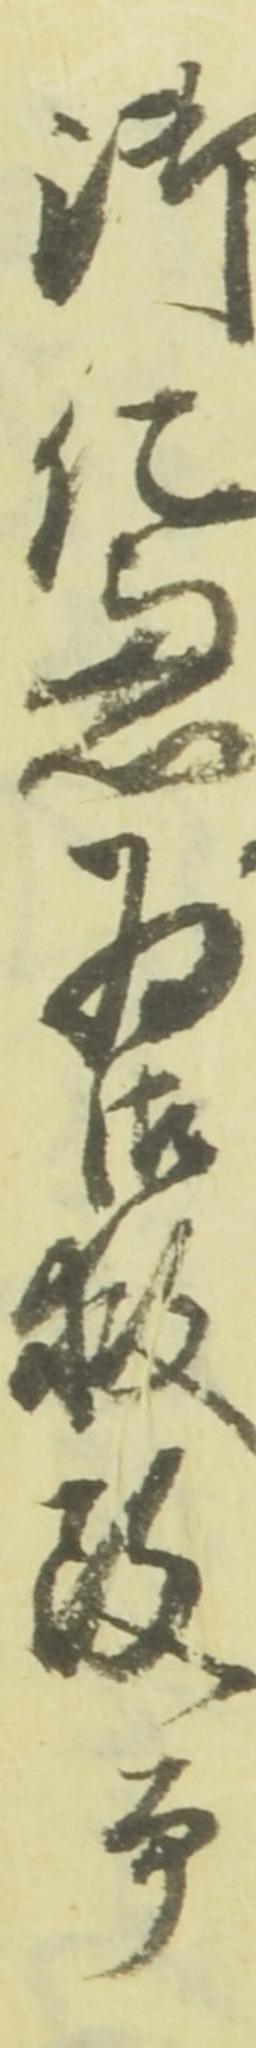御仁恵為御救改而
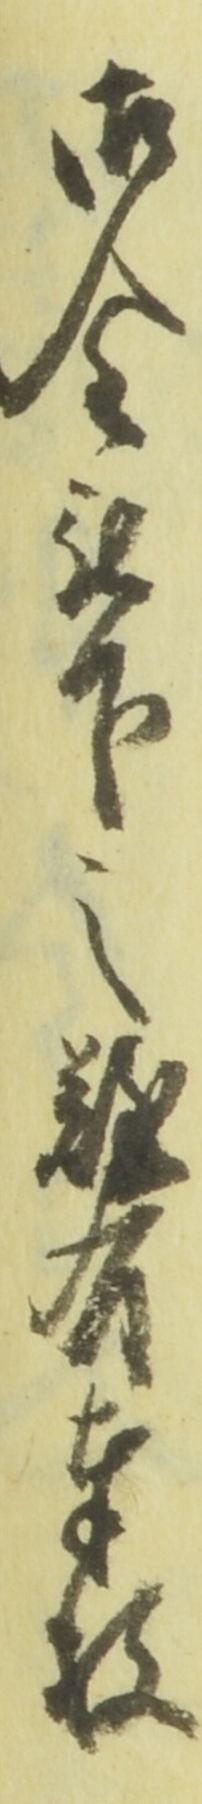御金被下之難有奉存
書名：御触書御書附控
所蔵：伊那市立高遠町図書館・合同会社AMANE
